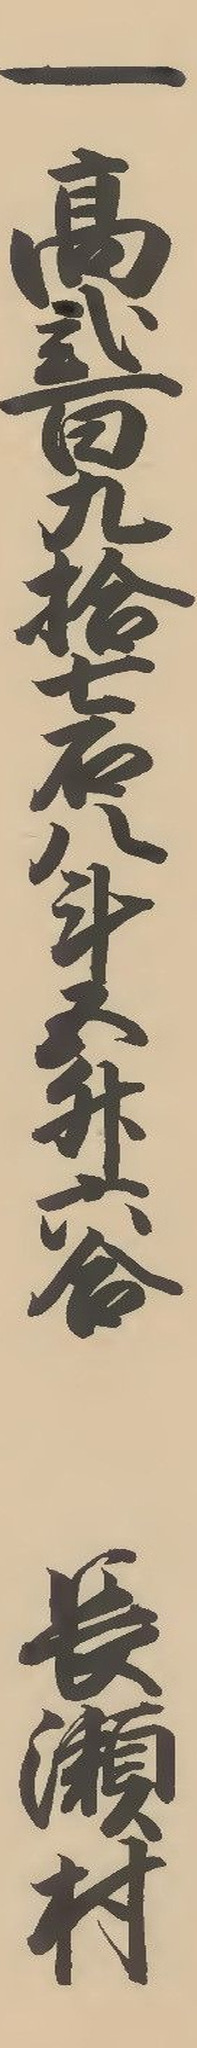一高弐百九拾七石八斗五升六合長瀬村
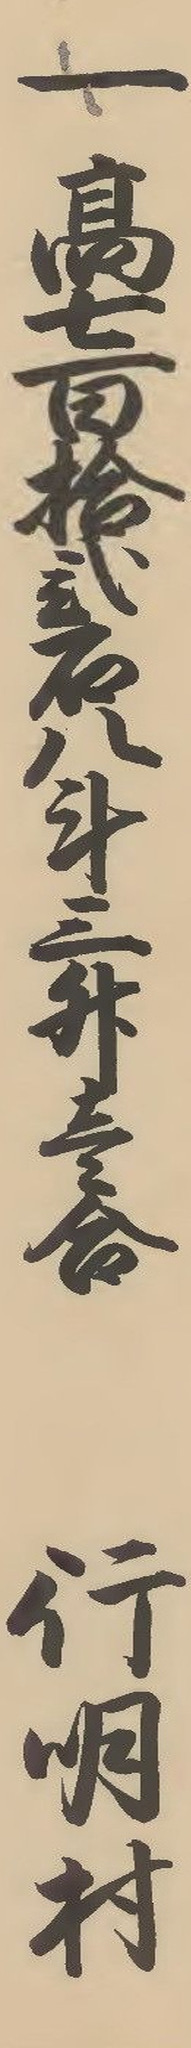一高七百拾弐石八斗三升壱合行明村
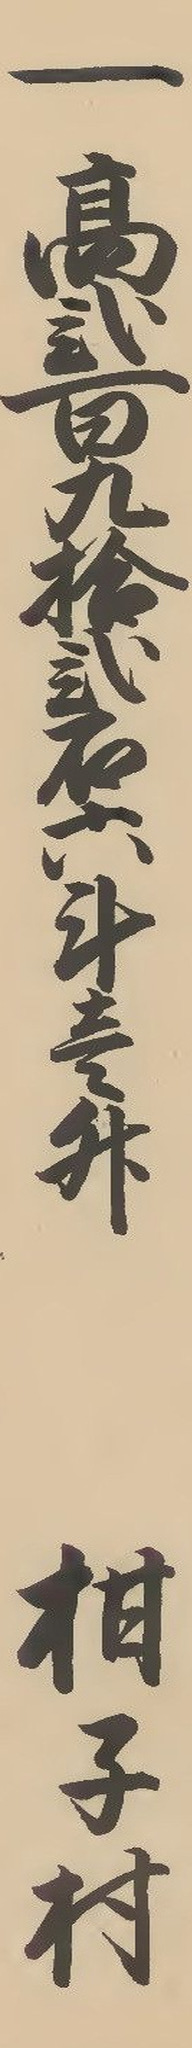一高弐百九拾弐石六斗壱升柑子村

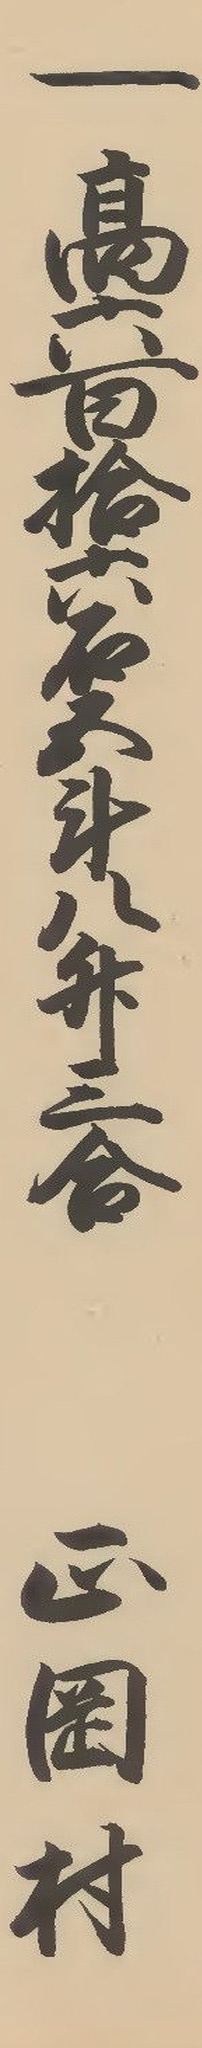一高六百拾六石五斗八升三合正岡村
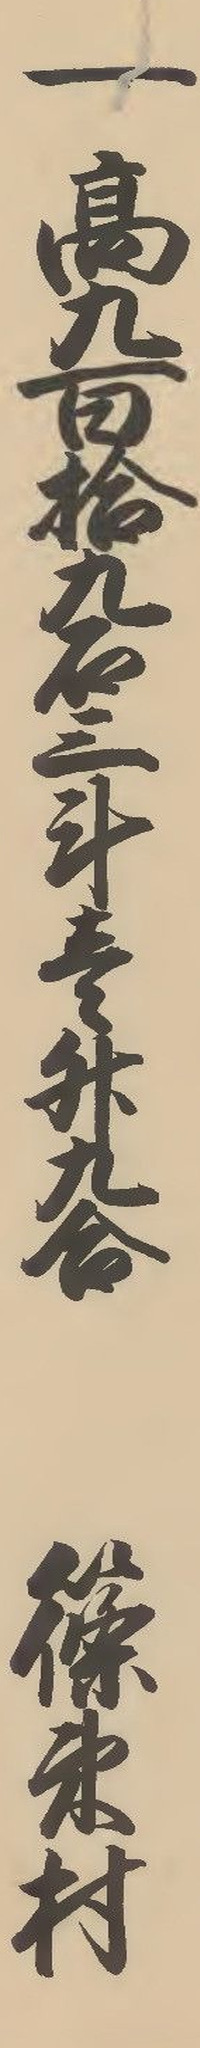一高九百拾九石三斗壱升九合篠束村
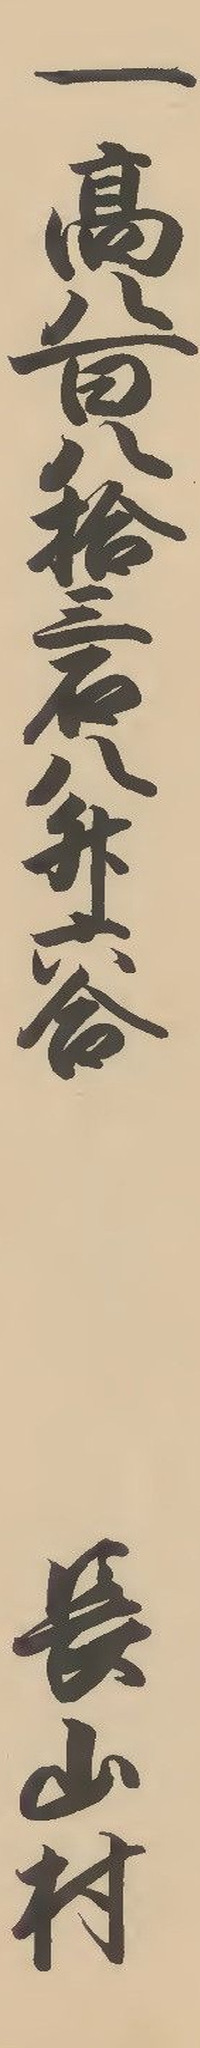一高八百八拾三石八升六合長山村
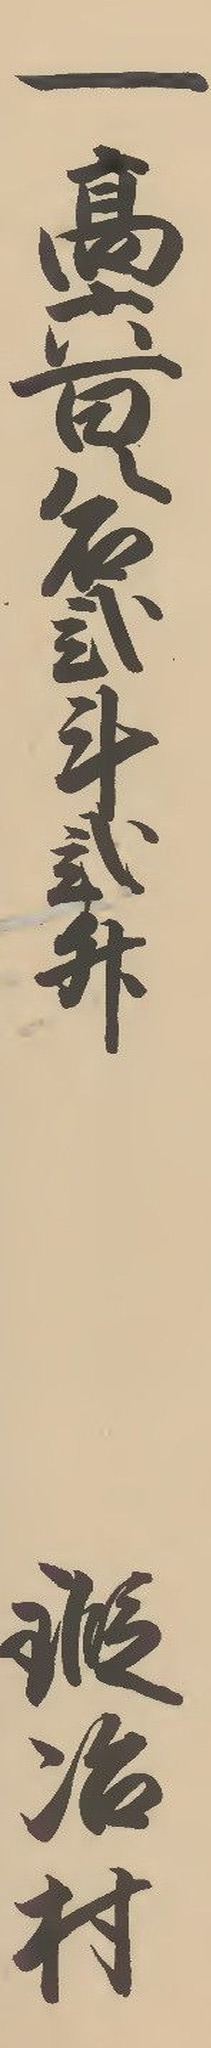一高六百八石弐斗弐升鍛冶村
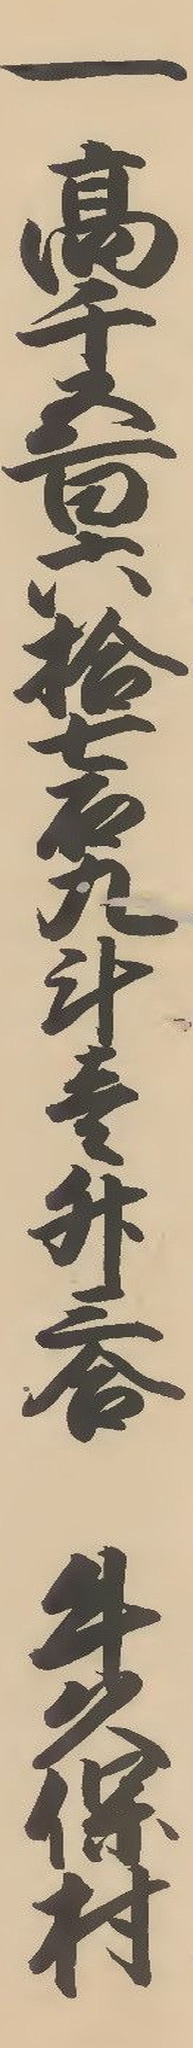一高千五百六拾七石九斗壱升三合牛久保村
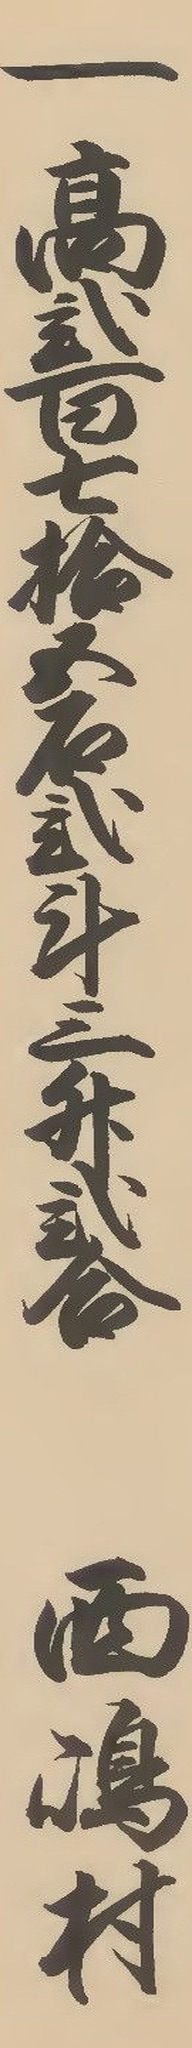一高弐百七拾五石弐斗三升弐合西島村
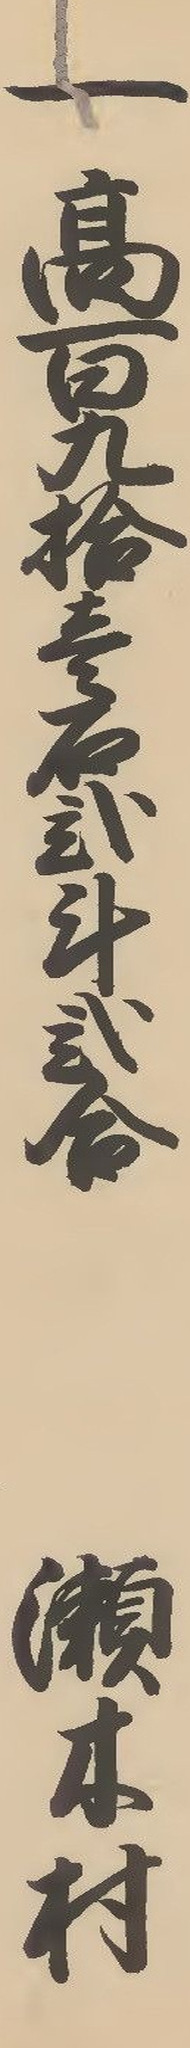一高百九拾壱石弐斗弐合瀬木村
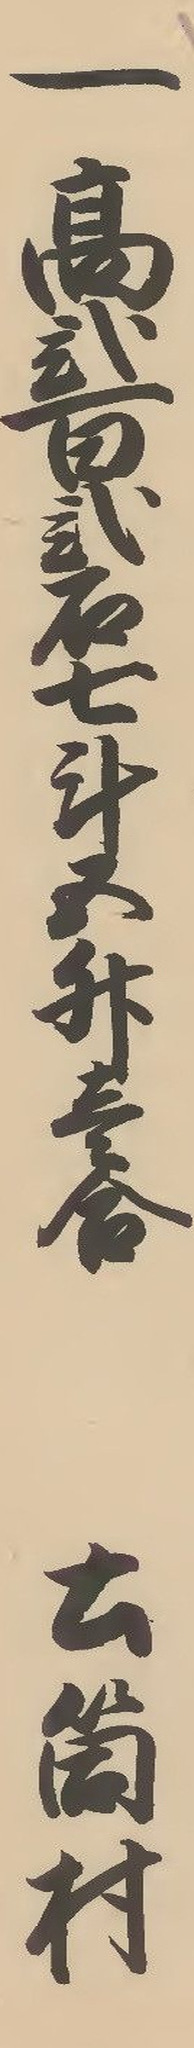一高弐百弐石七斗五升壱合土筒村

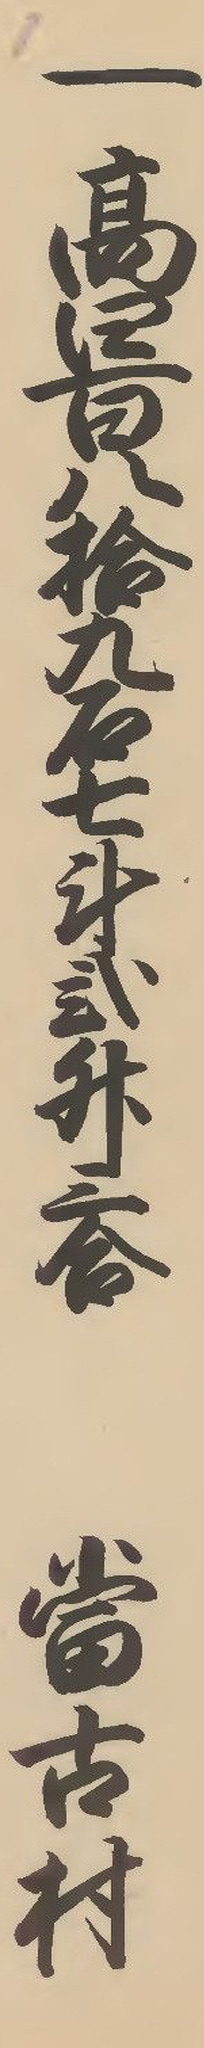一高四百八拾九石七斗弐升三合当古村
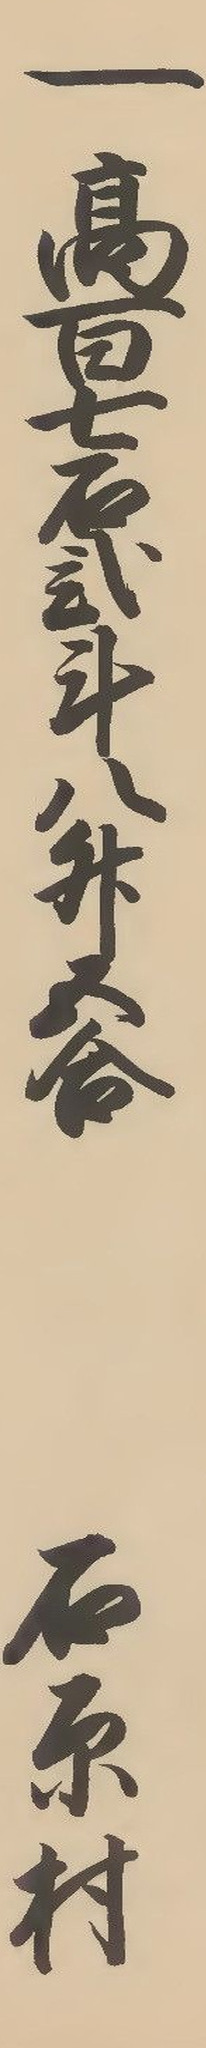一高百七石弐斗八升五合石原村
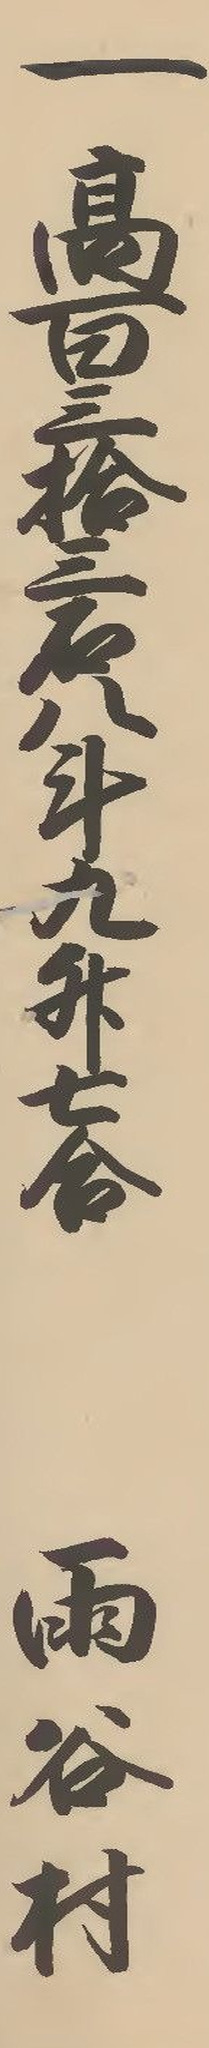一高百三拾三石八斗九升七合雨谷村
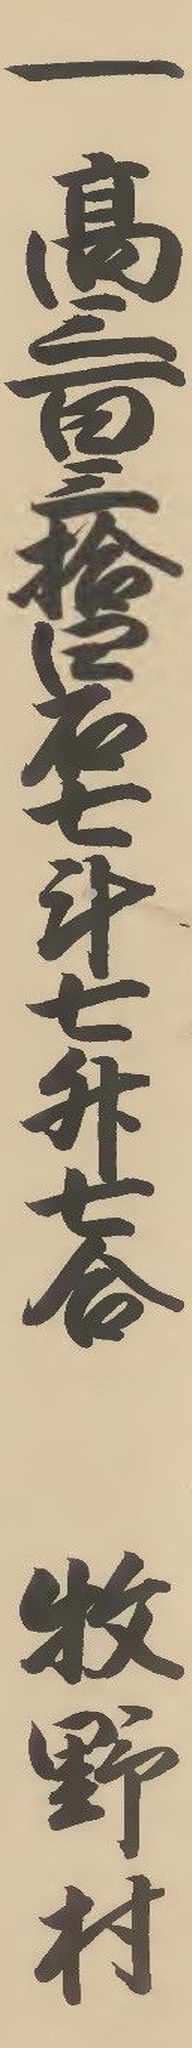一高三百三拾四石七斗七升七合牧野村
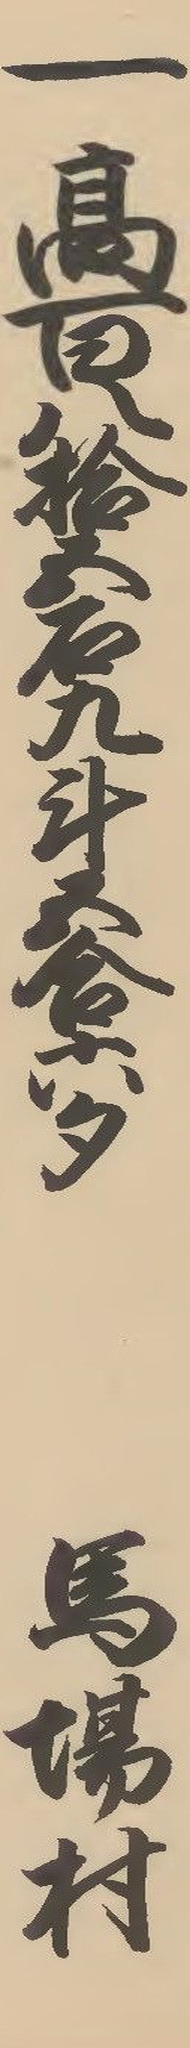一高百八拾五石九斗五合六勺馬場村
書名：三河国郷帳
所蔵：国立公文書館 National Archives of Japan
